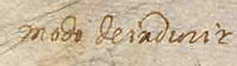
modo de induzir
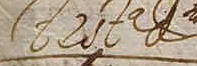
testa d̄o
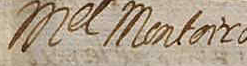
mel monteiro
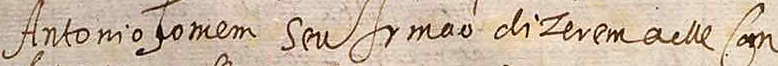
Antonio homem seu Jrmaõ dizerem a elle Com
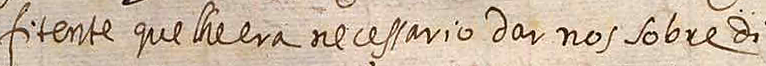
fitente que lhe era necessario dar nos sobredi
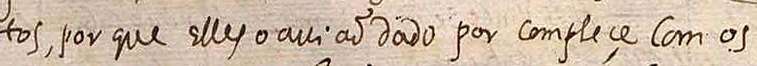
tos, porque Elles o auiaõ dado por complece Com os
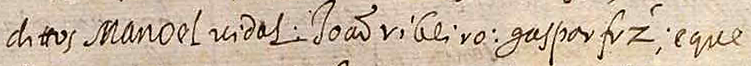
dittos Manoel uidaL: Joaõ ribeiro: gaspar frz̄; e que
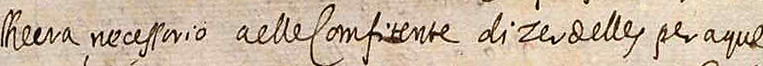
lhe era necessario a elle Comfitente dizer delles pera que
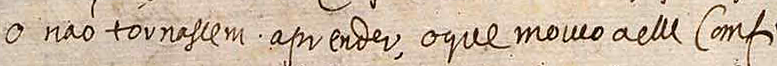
o naõ tornassem a prender, o que moueo a elle Comfi
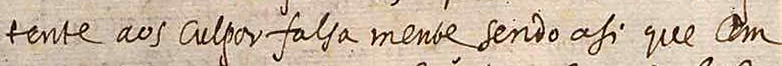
tente aos culpar falsamente sendo asi que Com
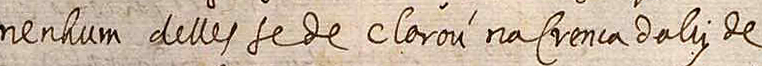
nenhum delles se declaroū na Crenca da ley de
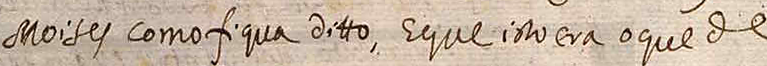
Moises como fiqua ditto, E que isto era o que de
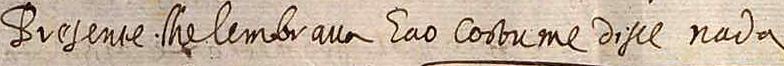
Presente lhe lembraua E ao costume disse nada
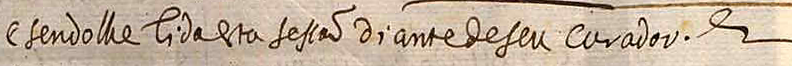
e sendolhe lida esta sessaõ diante de seu curador. E
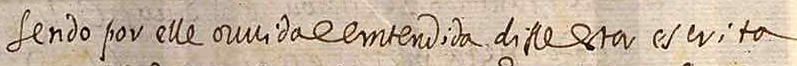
sendo por elle ouuida e emtendida disse estar escrita
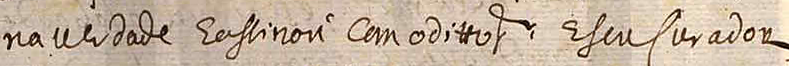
na uerdade E assinou com o ditto sor. E seu Curador
